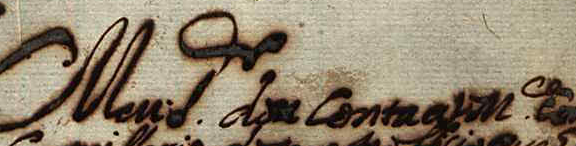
Meu s.r dou conta a VM.ce e _
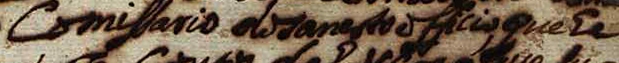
Comissario do sancto officio, que he
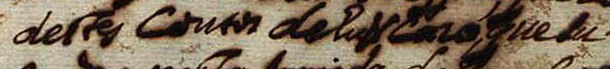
destes Coutos de hū cazo, que su
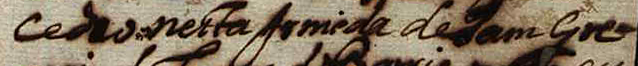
cedeo nesta Jrmida de Sam Gre
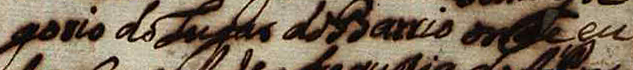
gorio do Lugar do Barrio onde eu
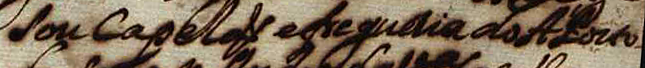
sou Capelaõ e freguezia do A Porto
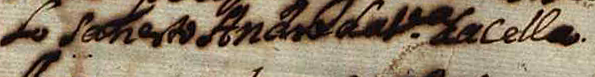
do Sancto Andre da V.a da cella.
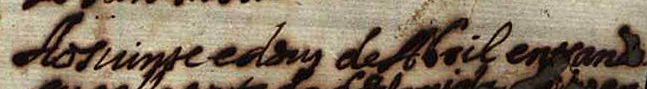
Aos uinte e dous de Abril entrando
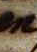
en
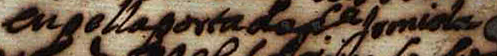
eu pella porta da d.a Jrmida
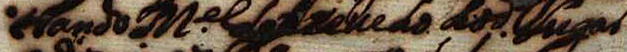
trando M.el de azeuedo do d. lugar
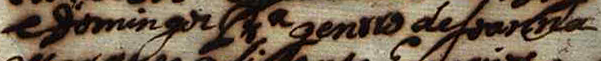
e Domingoz Pr.a genrro de Joanna
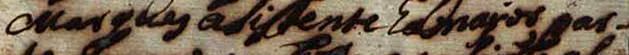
Marques asistente ha mayor par
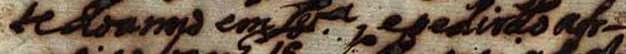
te do anno em Lx.a, e pedindo a fr
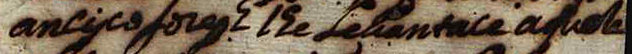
ancisco Jozeph lhe leuantace aquele
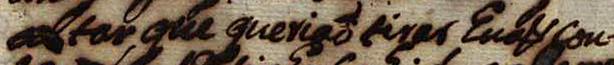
altar, que queriaõ tirar huā cou
